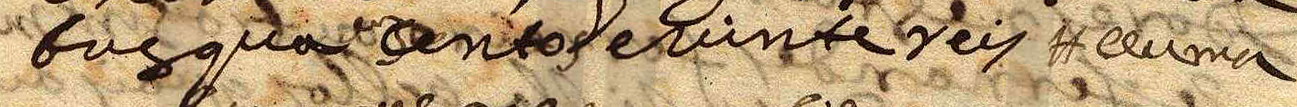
busqua cento e vinte reis item e eu ma
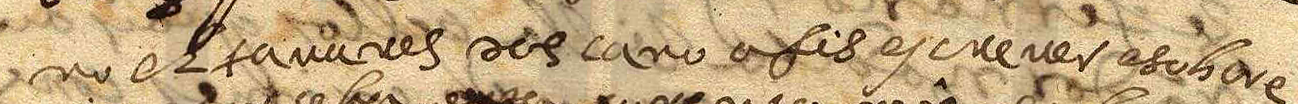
noel tauares toscano o fis escreuer e sobscre
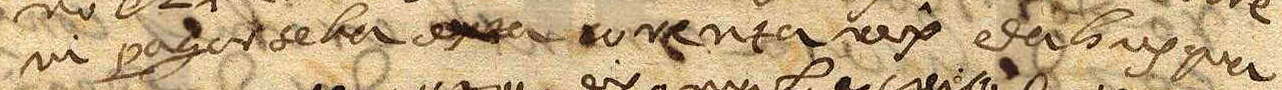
ui pagar se ha cento corenta reis e da busqua
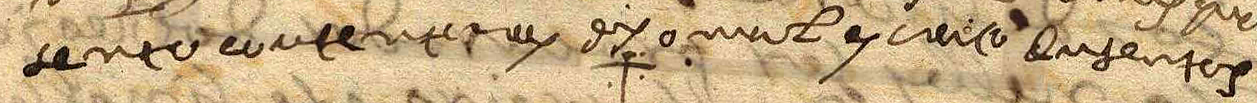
sento e outenta reis dis o mal escrito dusentos
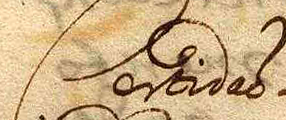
Certidaõ
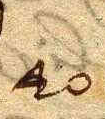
40
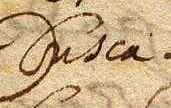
busca
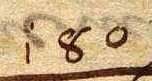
i80
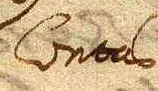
Conta
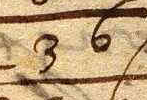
36
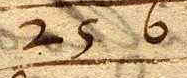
256
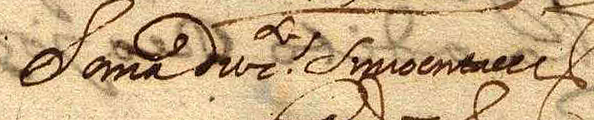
Soma duz.tos Sincoenta seis
